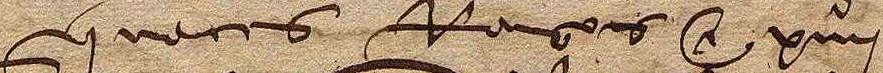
sjnaes Rasos ē xiiijo
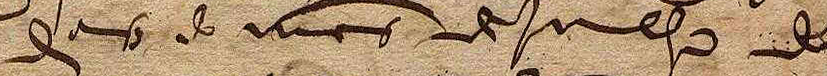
djas do mes de Julho de
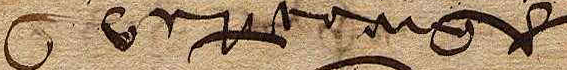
j̄ vc Rta anꝯ
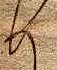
Rꝭ
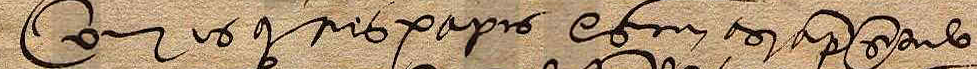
Com os quaes papes e sn̄ça asj ap̄sētado
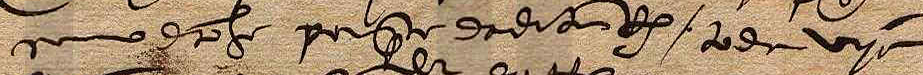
como dt̄o he por p̄te da dita Rꝭ / todavya
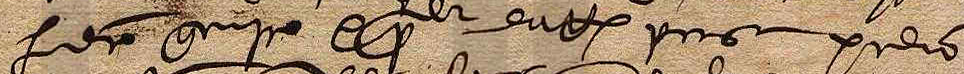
ho dtō genrro e pdor da Rꝭ presa pedio
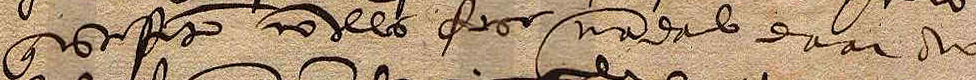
q̄ este fctō c̄o elles fose mādado daar Ao
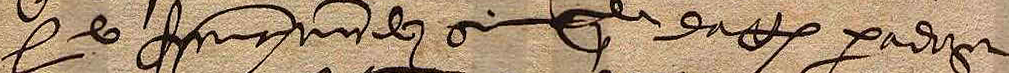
Ldo fernā mēdez seu pdor da Rꝭ ꝑa dizer
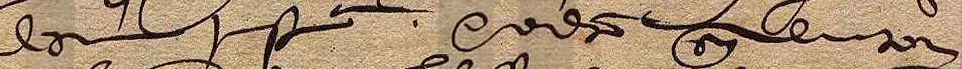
de sua Justa . e o dt̄o s̄or doutor
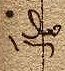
mdo
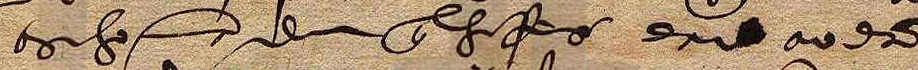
asi ho mādou q̄ lhe fose dado ao dt̄o
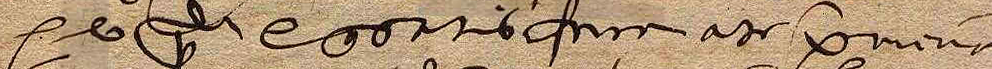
Ldo pdor e q̄ satisfaça ate p̄meira
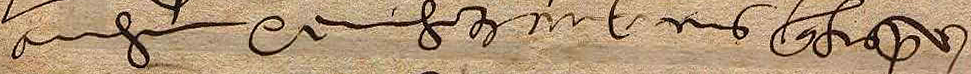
audja e eu djo trauaços q̄ ho esp̄vy
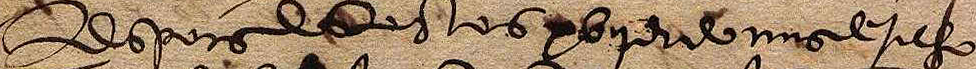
E despois desto Aos xbij di do mes de Julho
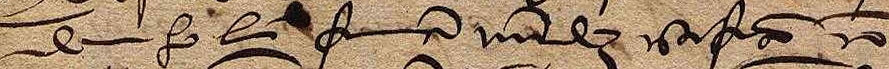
deu ho Ldo fernā mēdez este fctō c̄o
